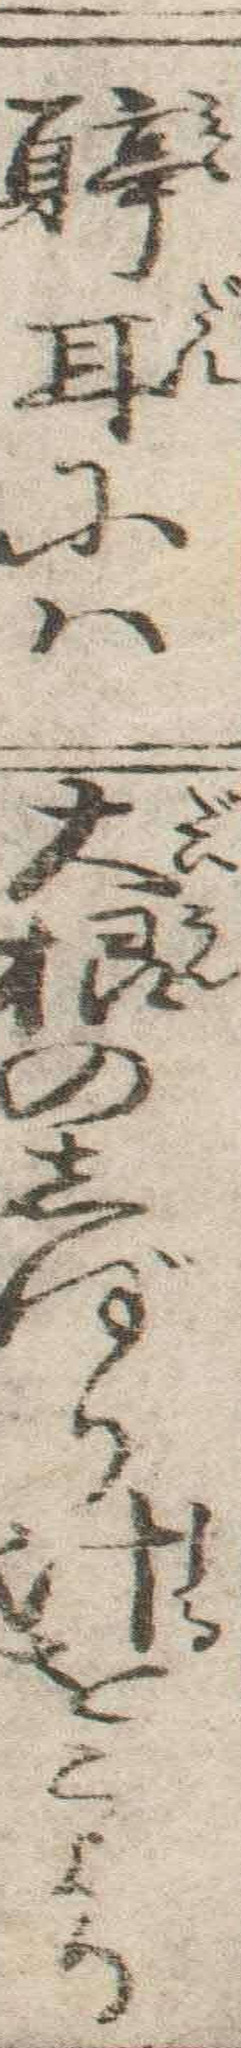聤耳には大根のしぼり汁をこより
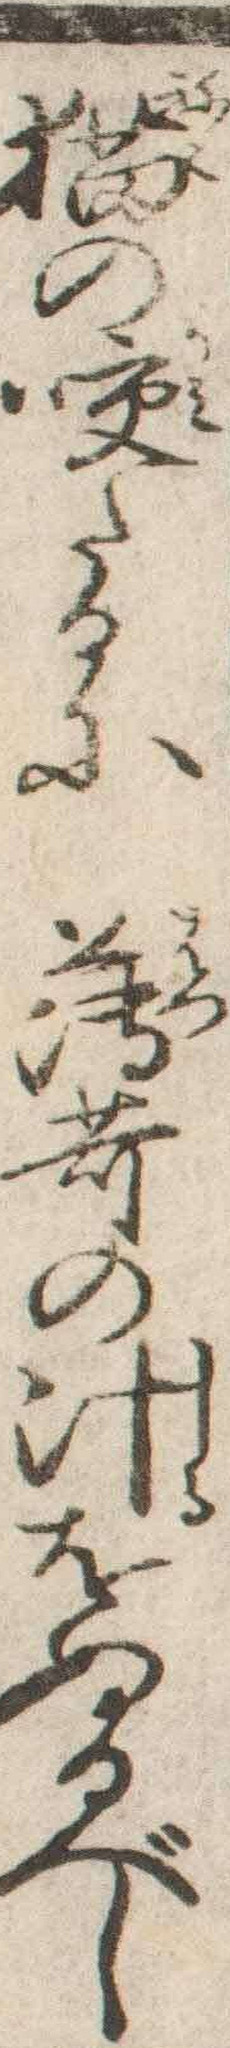猫の咬たるに薄荷の汁をぬるべし猫
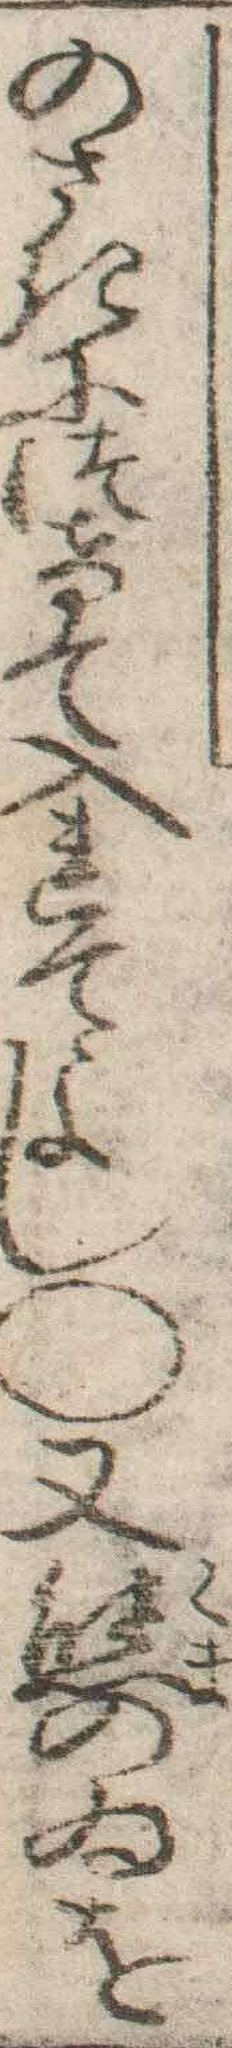のさきにつけて入れてよし〇又熊のゐを
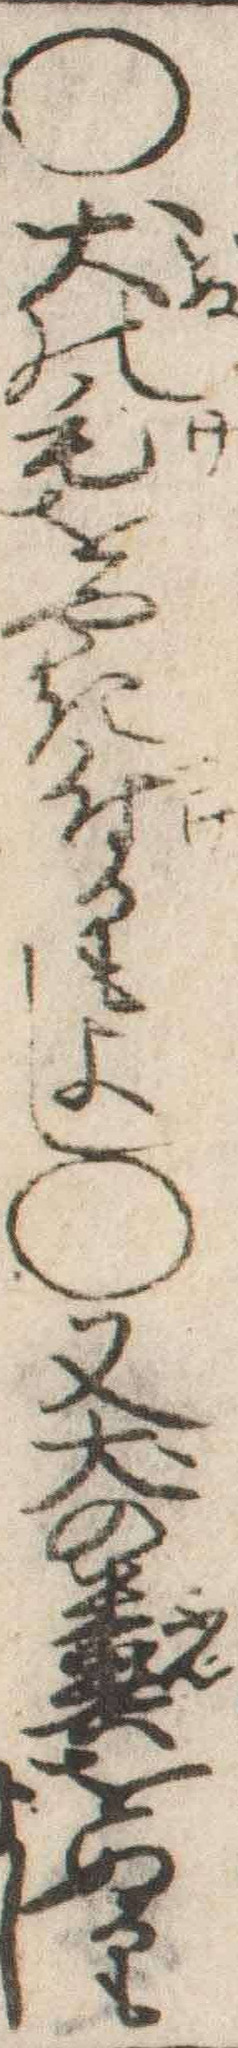〇犬の毛をやき付るもよし〇又犬の糞をぬるもよし
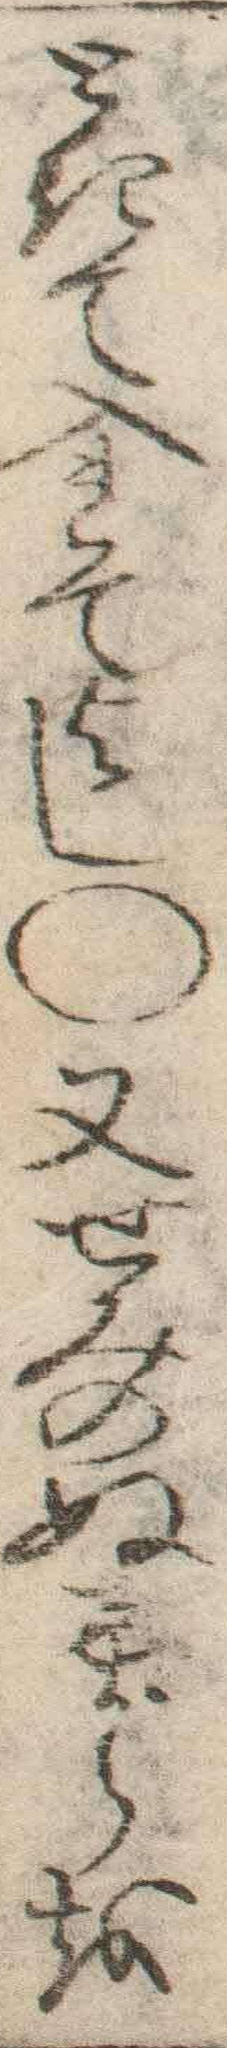ときて入れてよし〇又せみのぬけからを

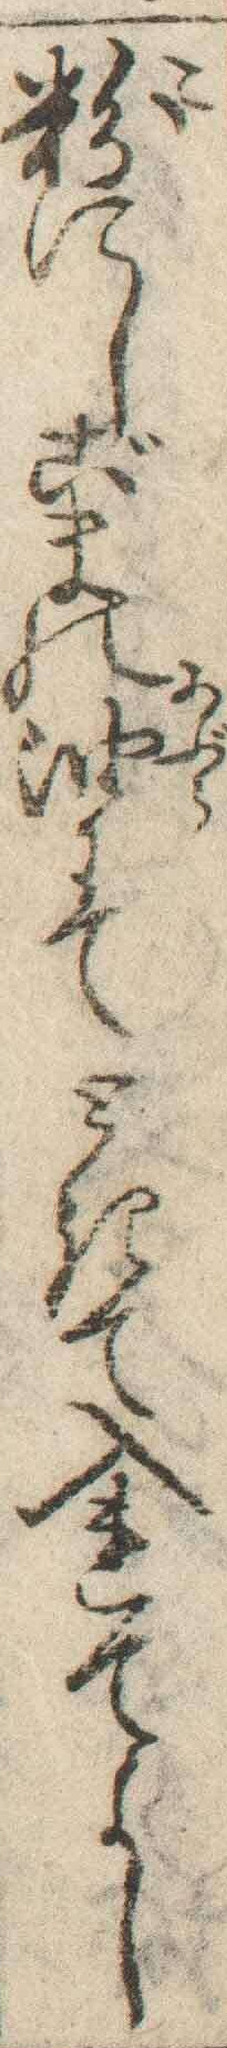粉にしごまの油にてときて入れてよし
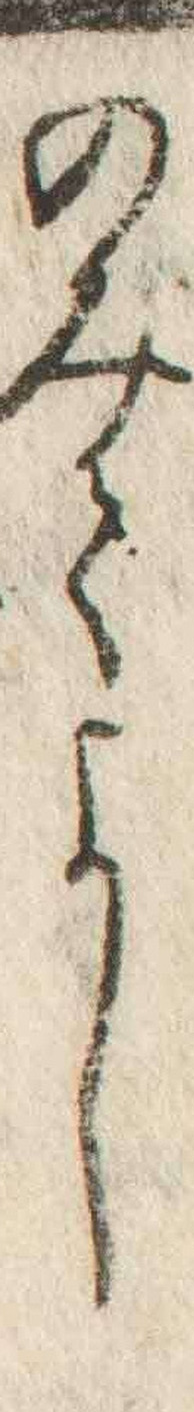のみてよし
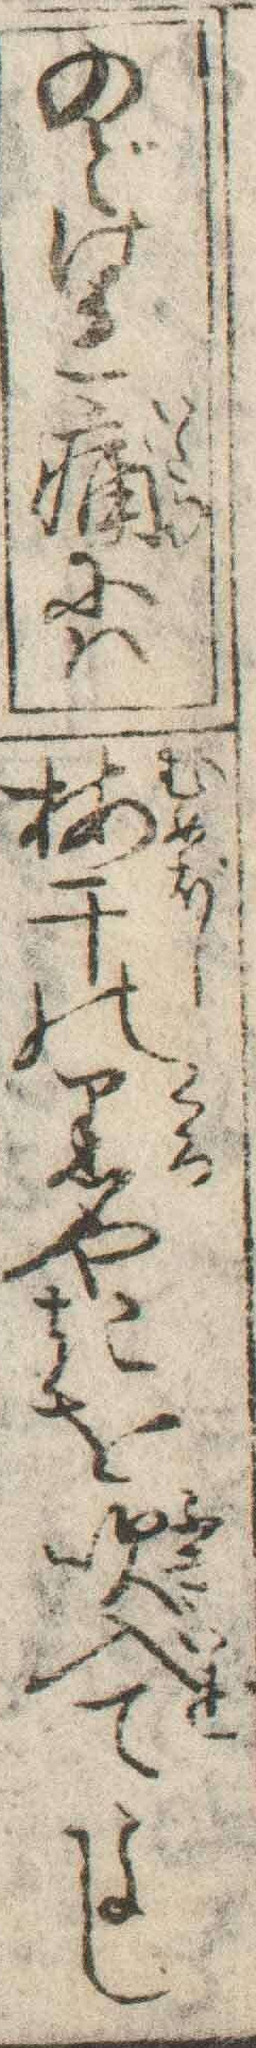のどけれ痛には梅干の黒やきを吹入てよし
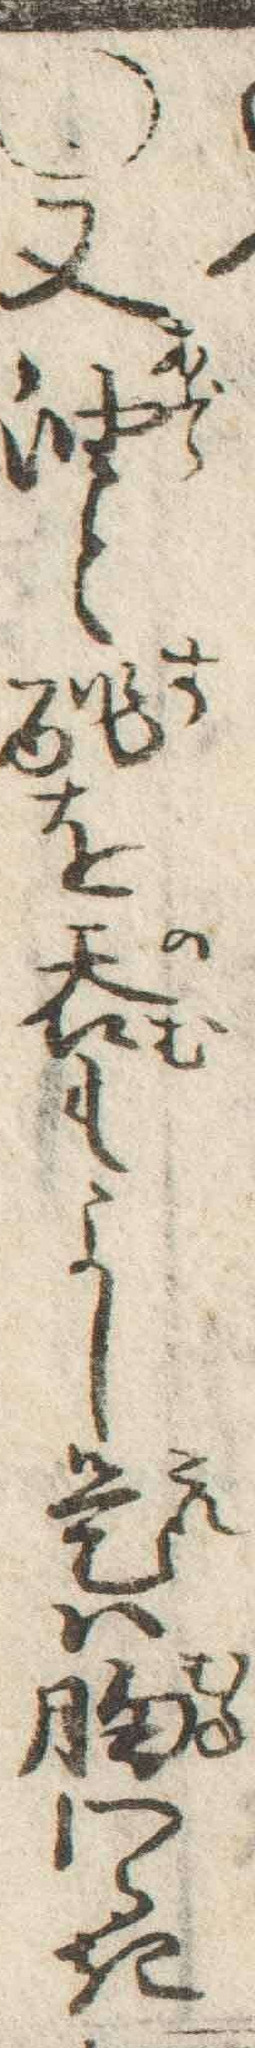○又油と酢を呑もよし是は胸わるき
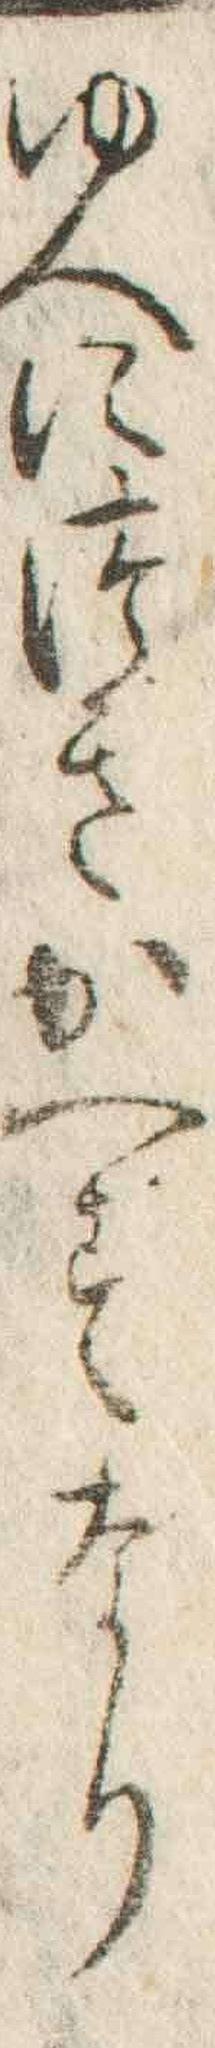ゆへにつきかへすなり
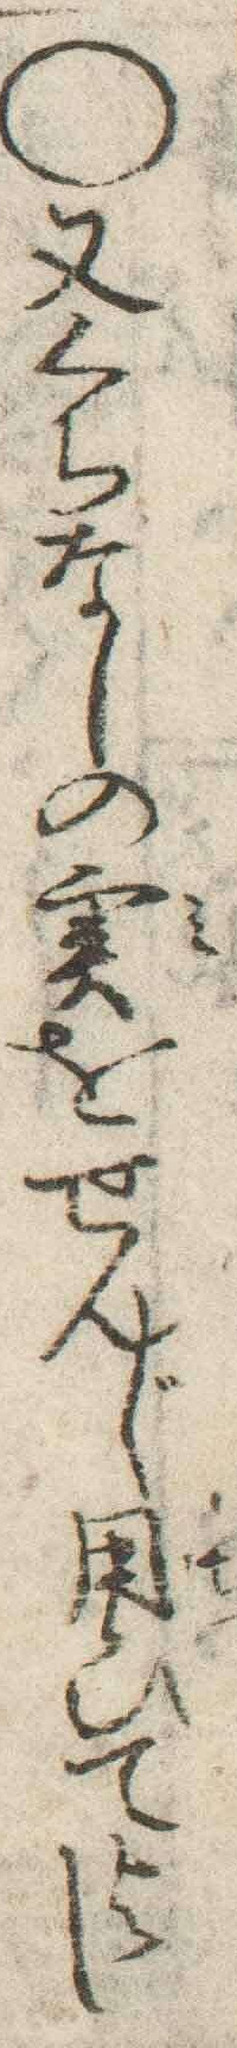○又くちなしの実をせんじ用ひてよし
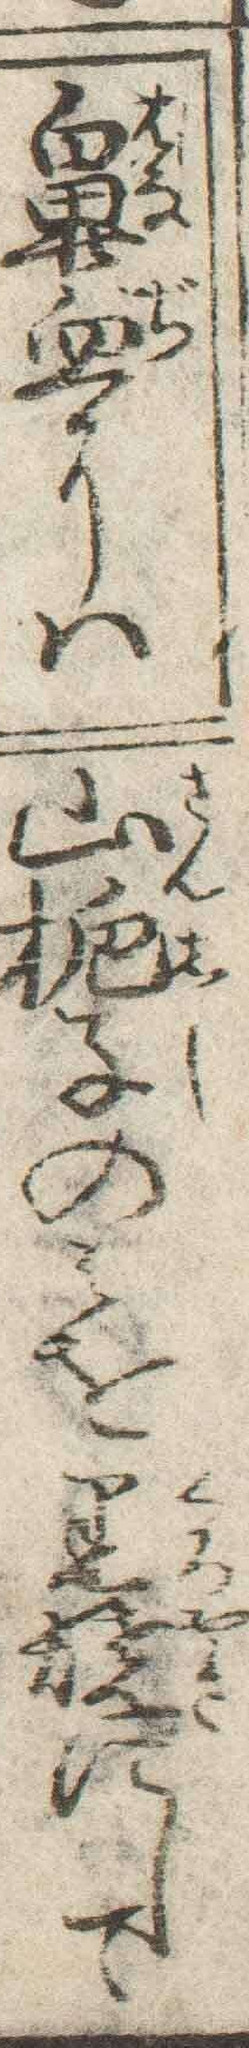鼻血には山梔子のはを黒焼にして
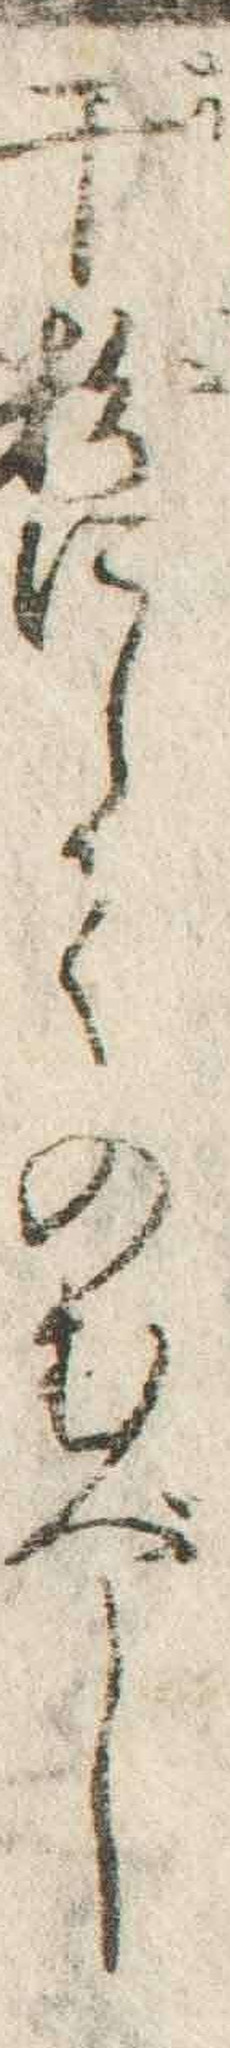干粉にしてのむべし
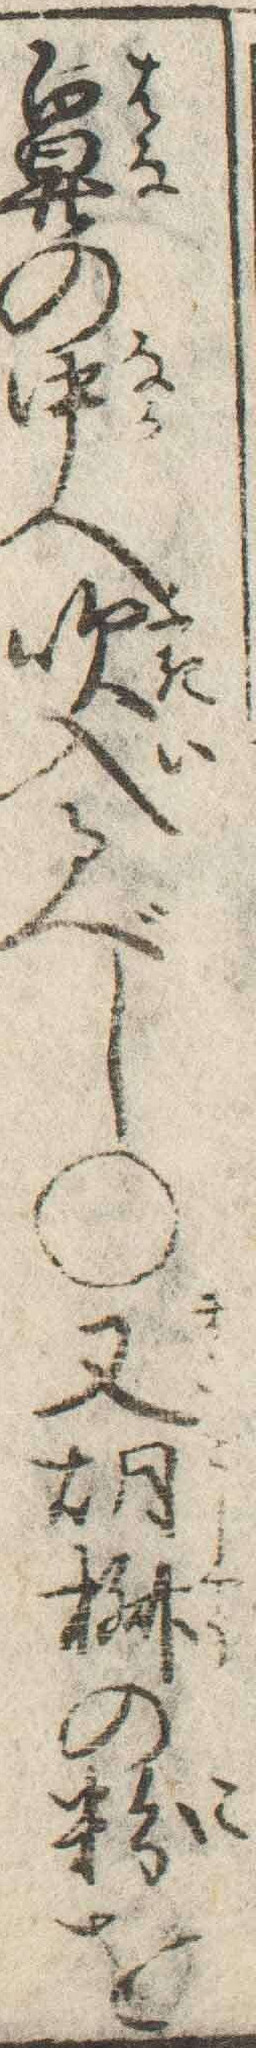鼻の中へ吹入るべし○又胡椒の粉を
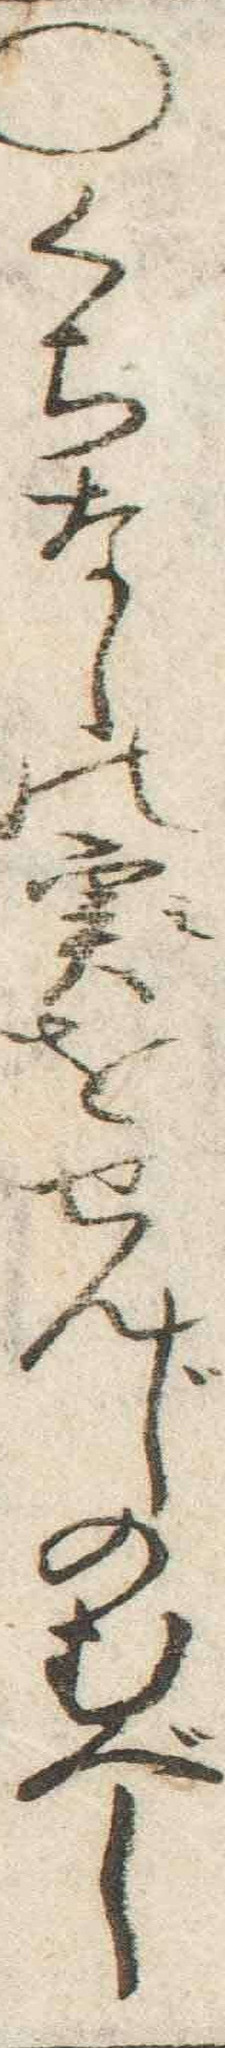○くちなしの実をせんじのむべし
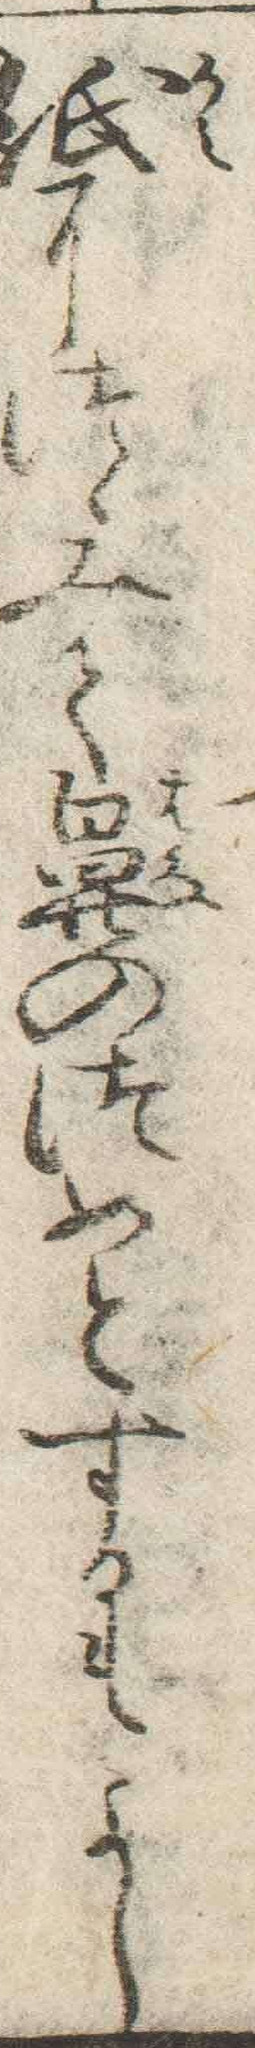紙につゝみて鼻のつめとするもよし
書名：撫育草
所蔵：東京学芸大学附属図書館 国文学研究資料館
